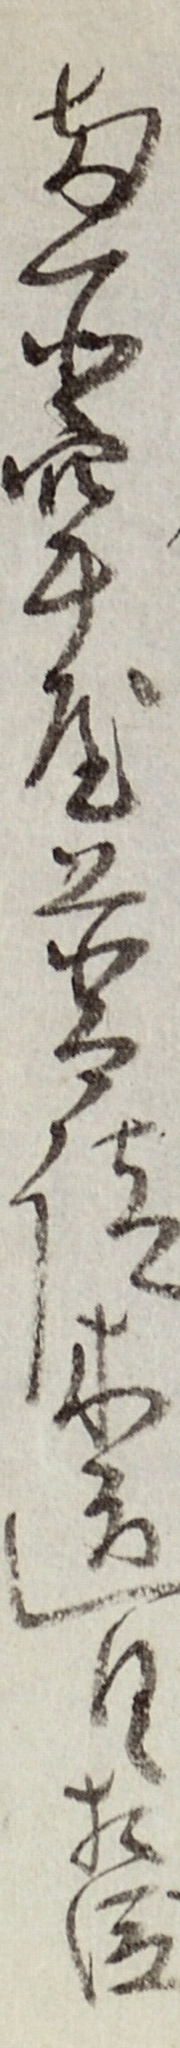両所牢屋普請木道具相渡
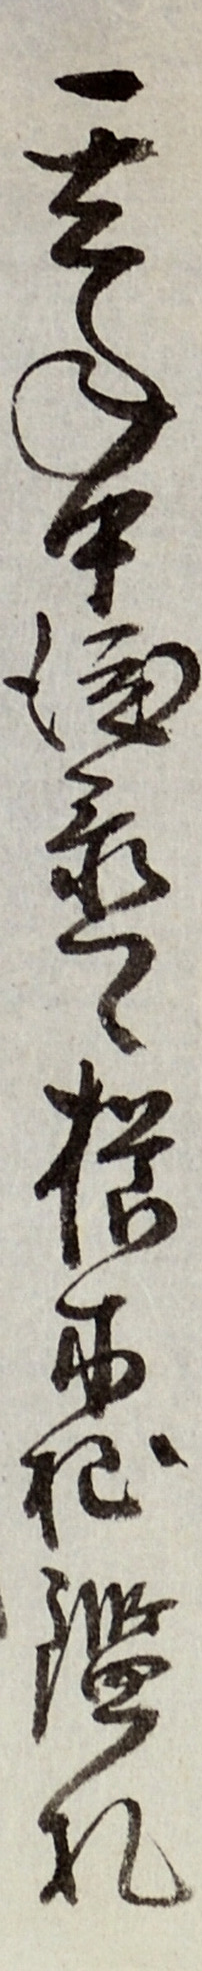一去年中渡置候櫛木杣鑑札
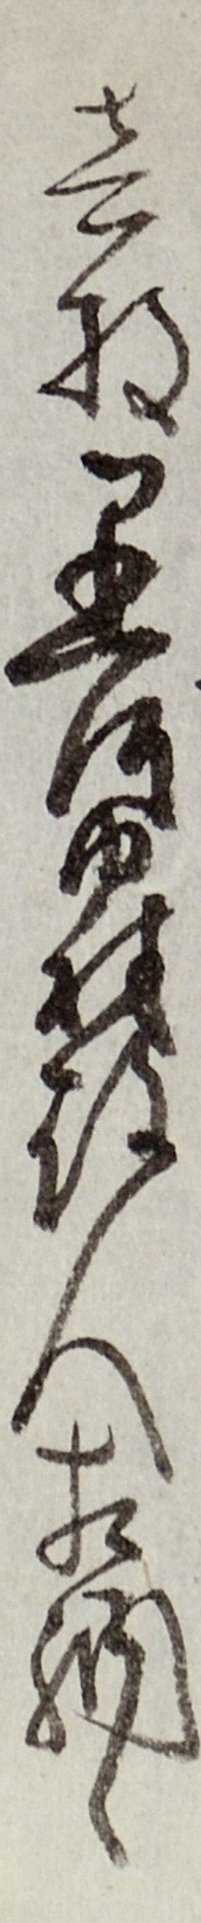壱枚黒河内村役人相納候
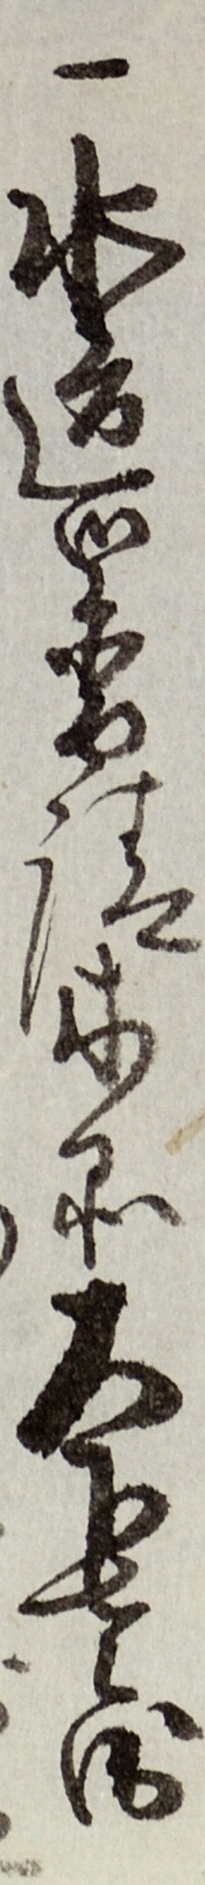一水道御普請木品大下七兵衛
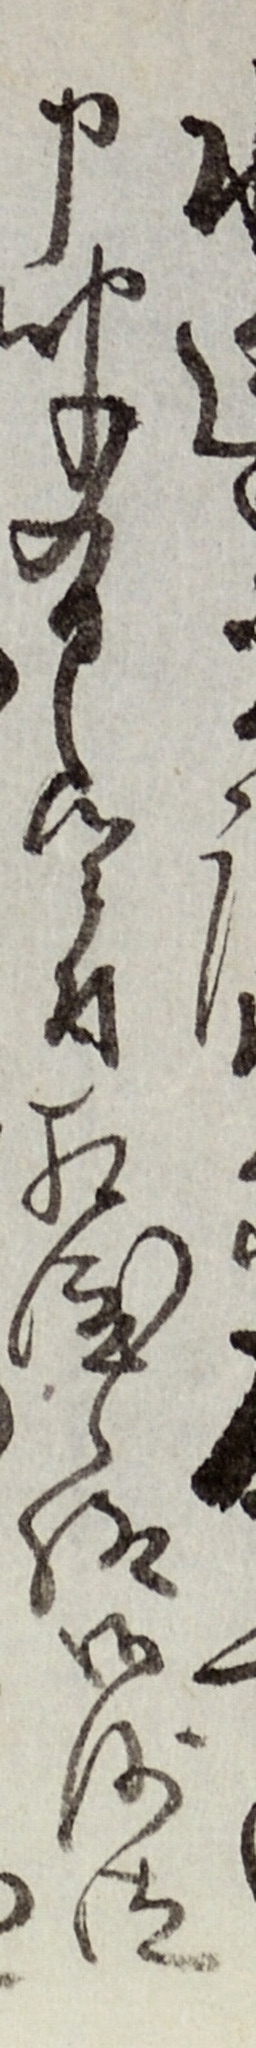申聞有之候ニ付相渡候様御沙汰
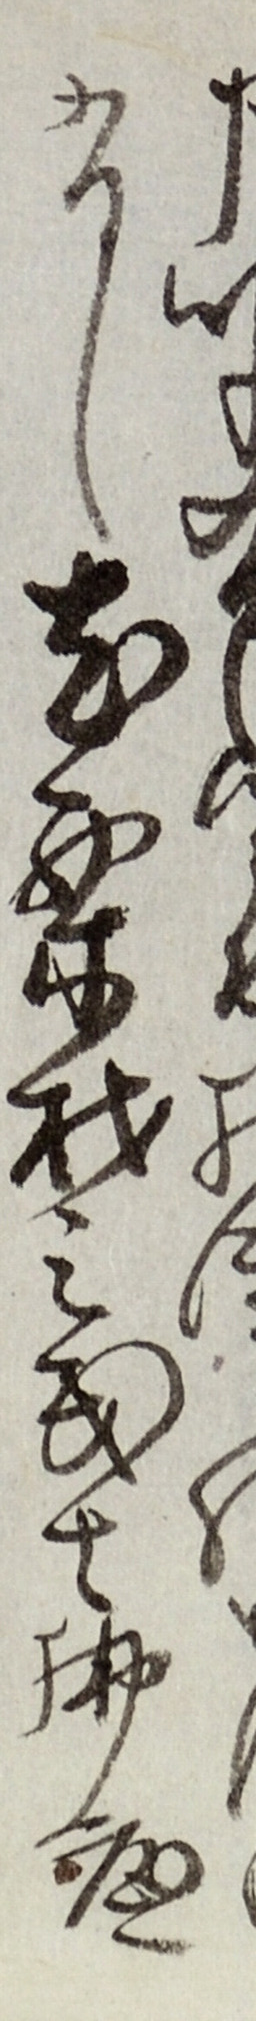有之候尤栗材之義者払底
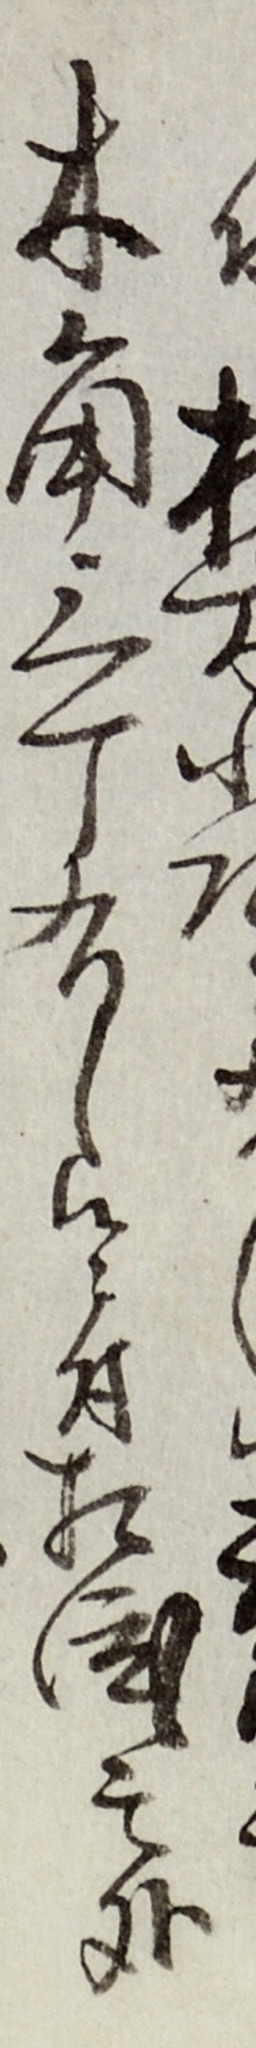木角三丁有之候ニ付相渡候其外
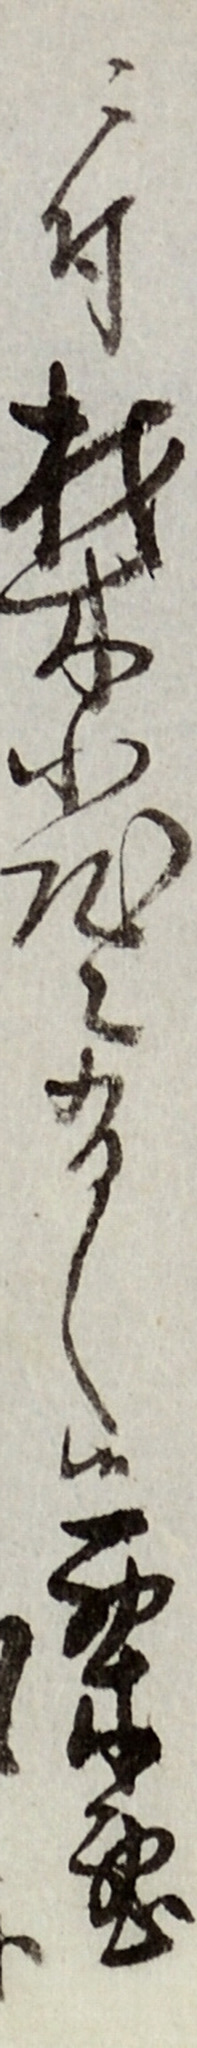ニ付材木小屋ニ有之候栗悪
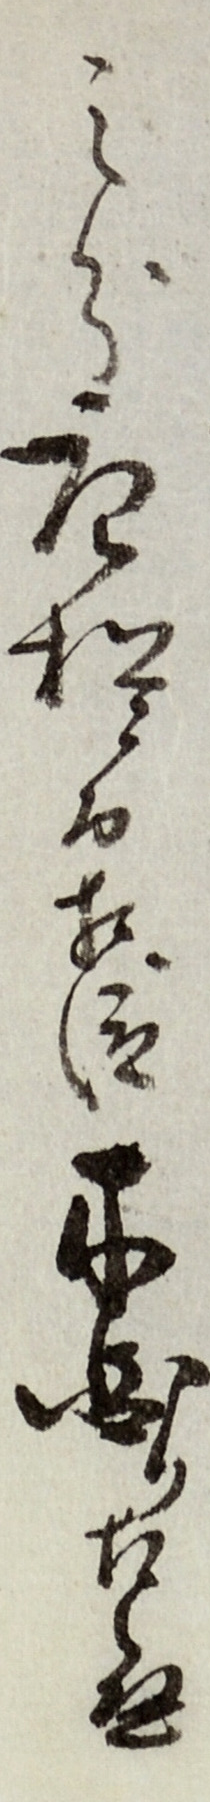之分唐松ニ而相渡木図り左之通
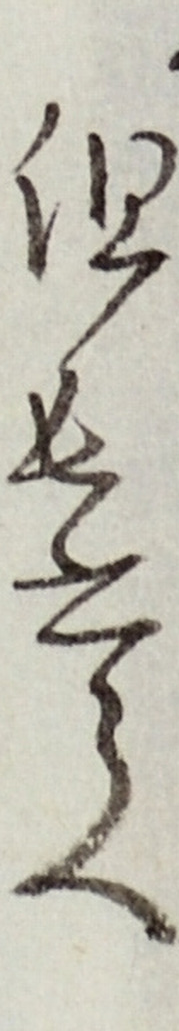但長六尺
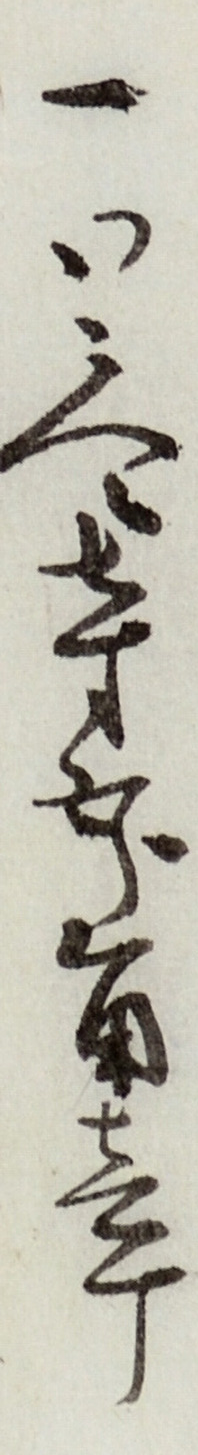一同尺ニ七寸五分角壱丁
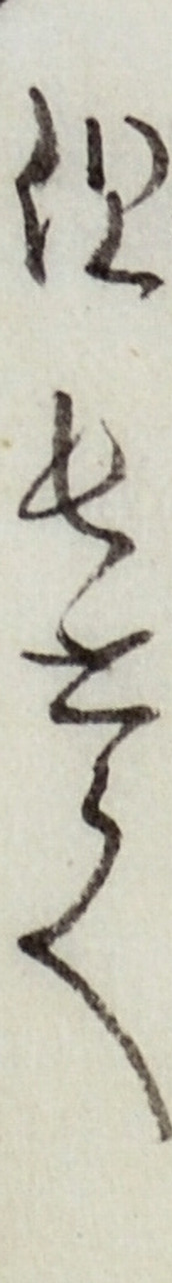但長六尺
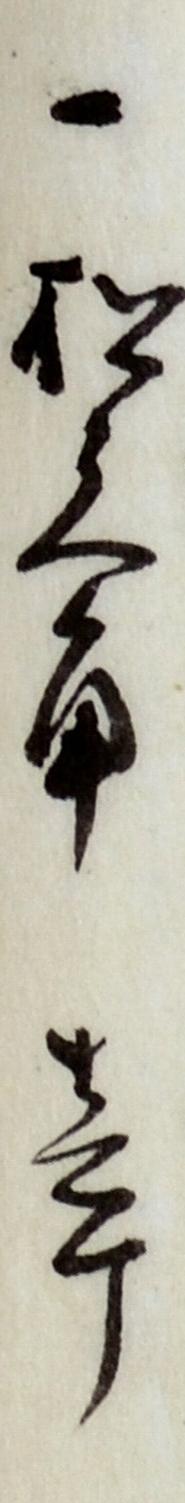一松尺角壱丁

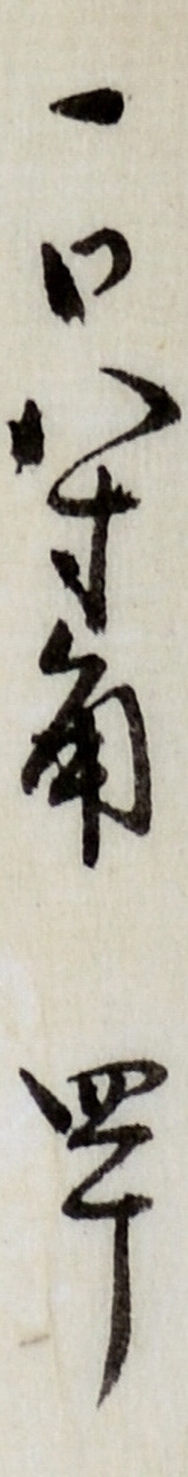一同八寸角四丁
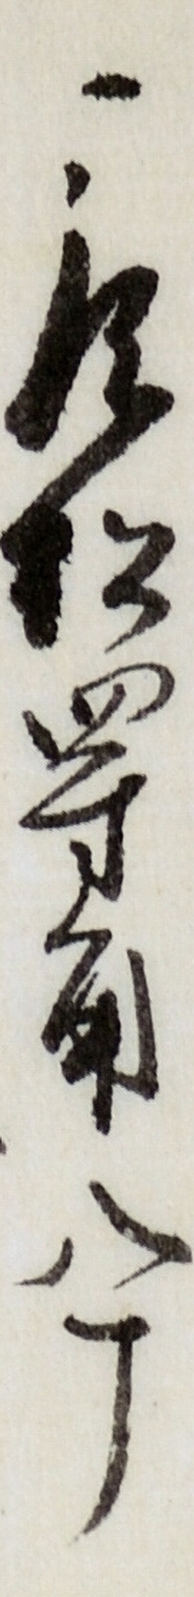一唐松四寸角八丁
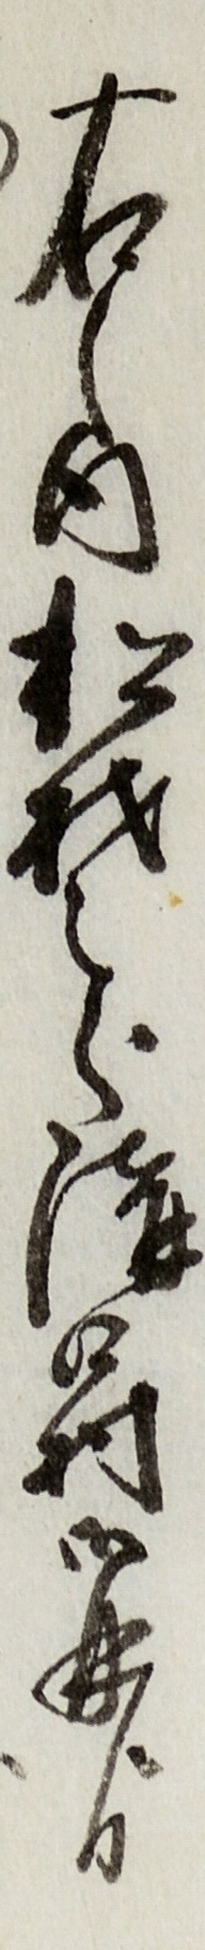右之内松材之分溝口村御林ゟ
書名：御山方御薪方諸事御用留
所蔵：伊那市立高遠町図書館・合同会社AMANE
